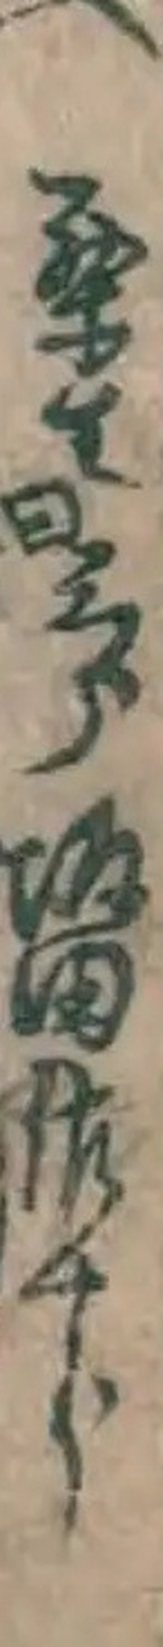栗生三郎坂田佐十郎
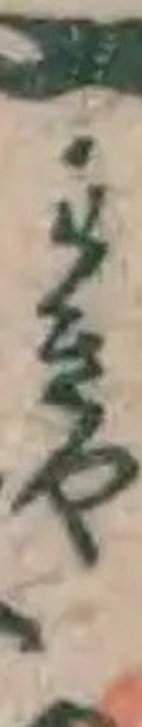わきや
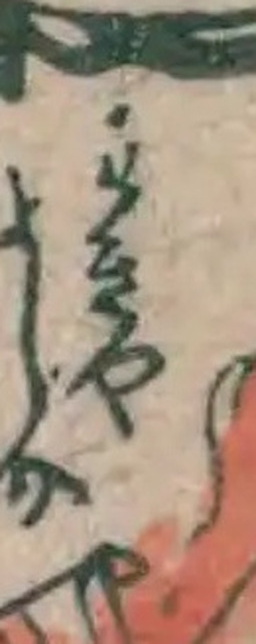わきや
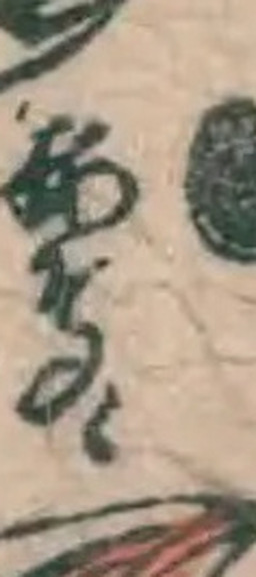梅そのゝ
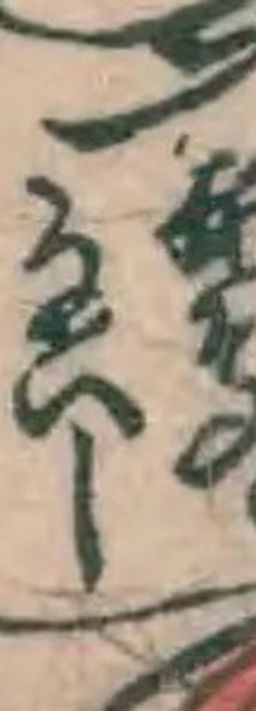ないし
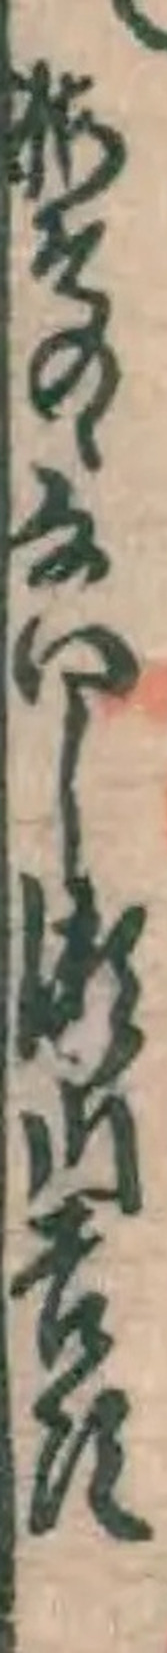梅そのゝないし瀬川吉次
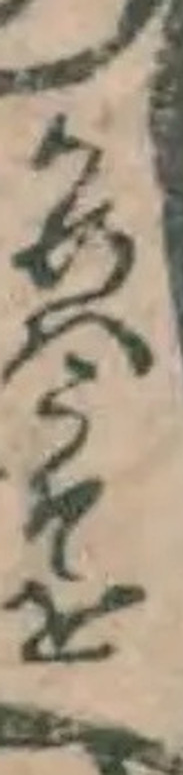かめはうそを
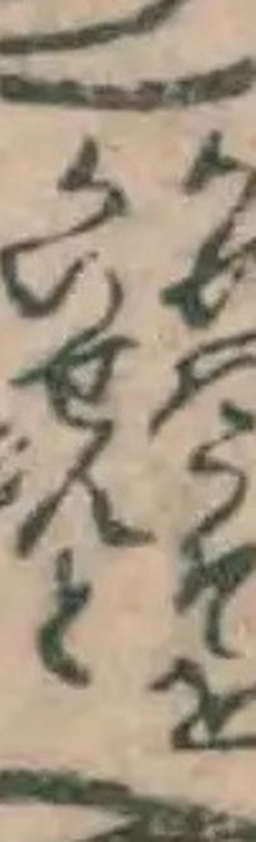かいせんと
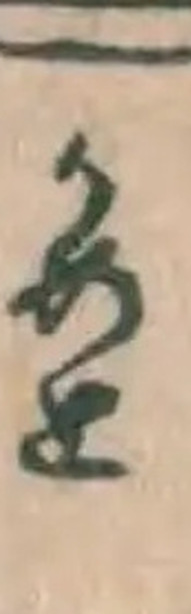かめと
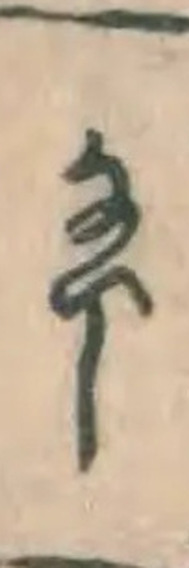ないし
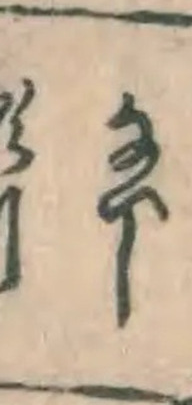ないし
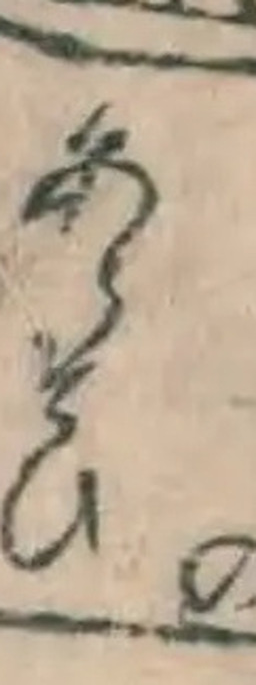あらそひ
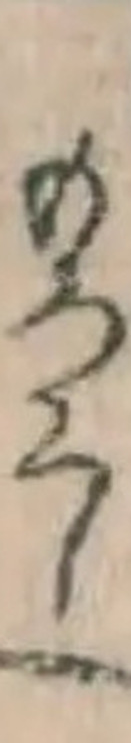もろこし
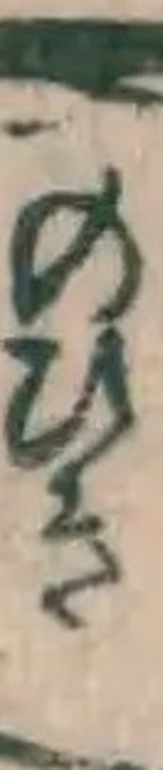のひき
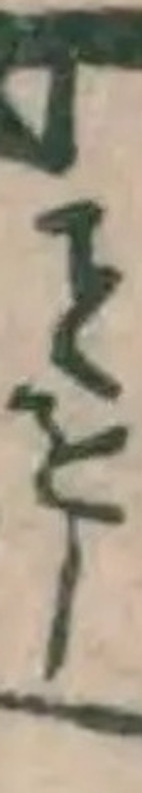ことをし
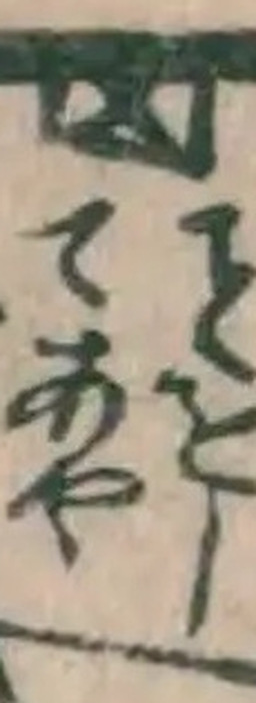てあや
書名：親船太平記
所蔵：国立国会図書館 National Diet Library, JAPAN
